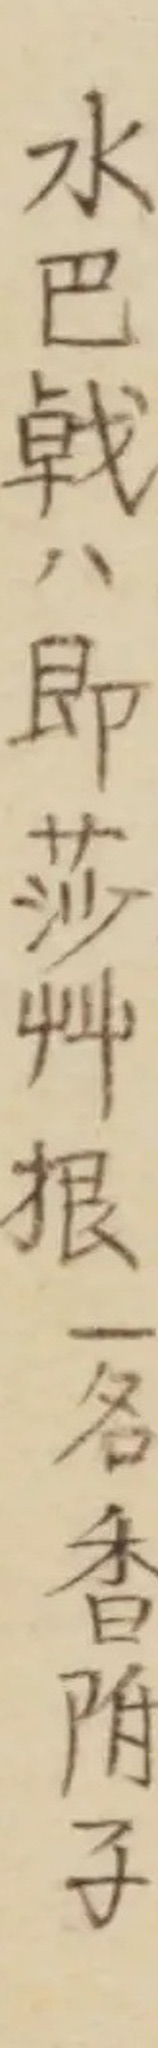水巴戟は即莎艸根一名香附子
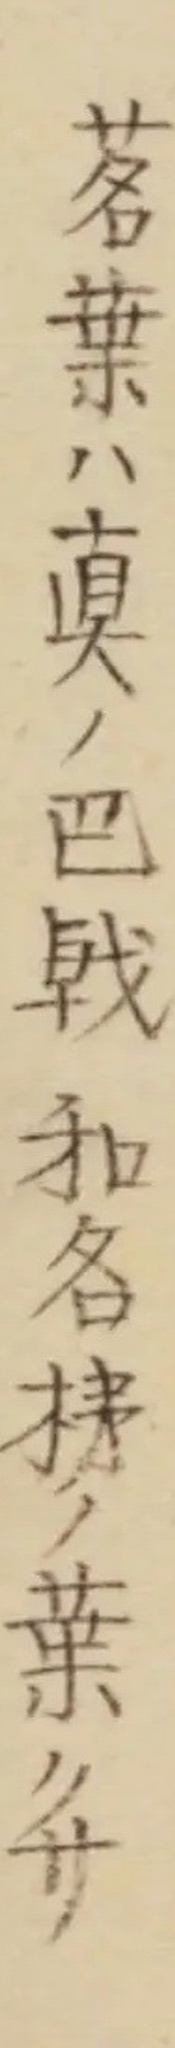茗葉は真の巴戟和名柹の葉くさ

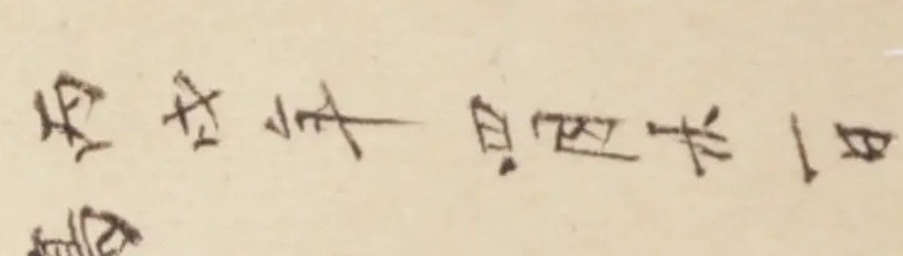丙戌年四月末一日
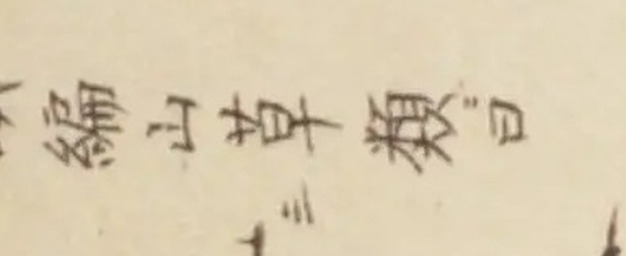多識編山草類に曰
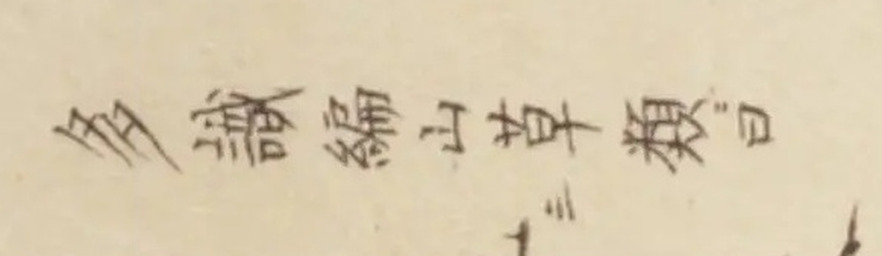多識編山草類に曰

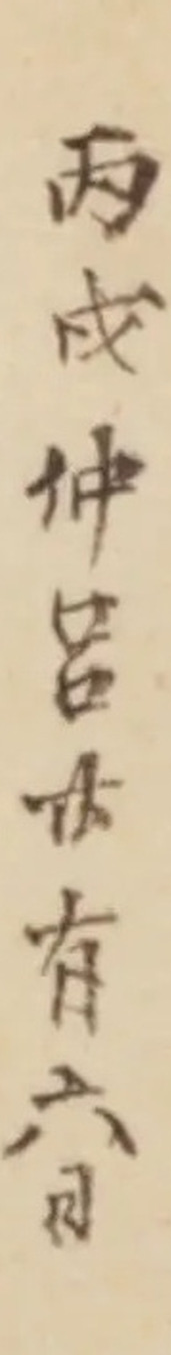丙戌仲呂廿有六日
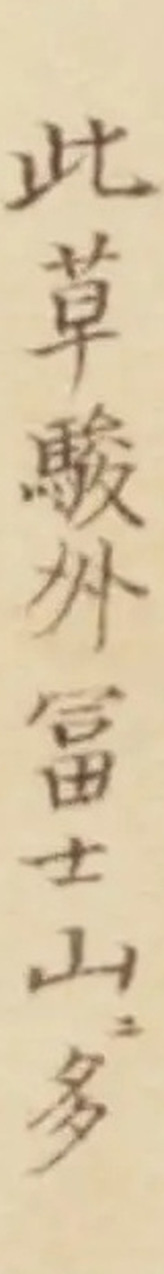此の草駿外冨士山に多
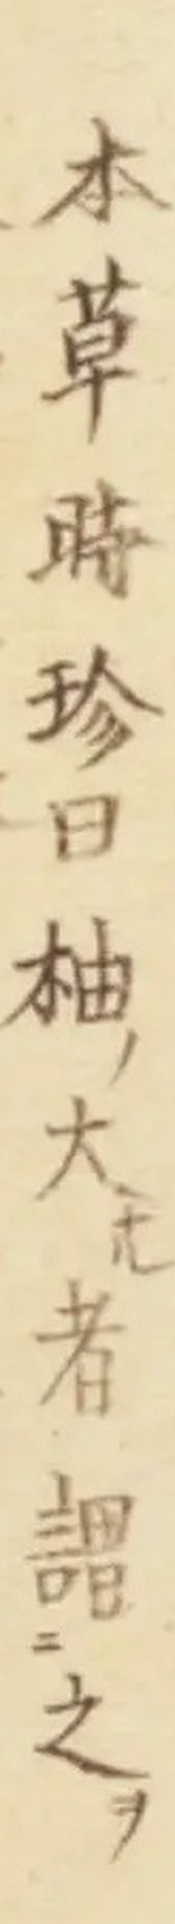本草時珍曰柚の大なる者謂之を
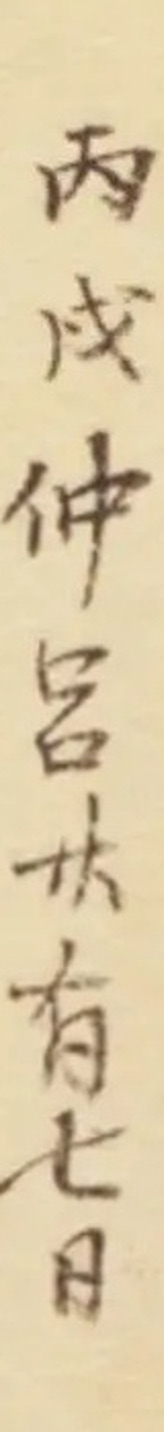丙戌仲呂廿有七日
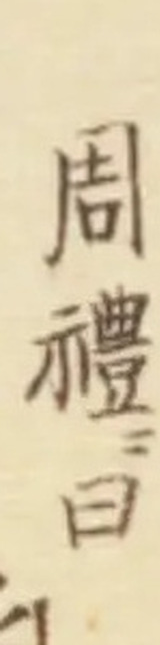周禮に曰

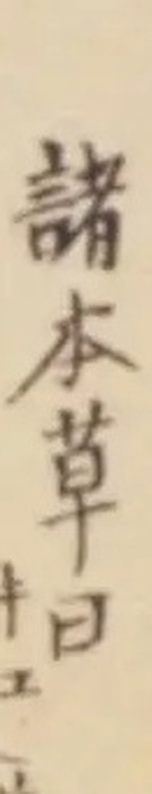諸本草曰
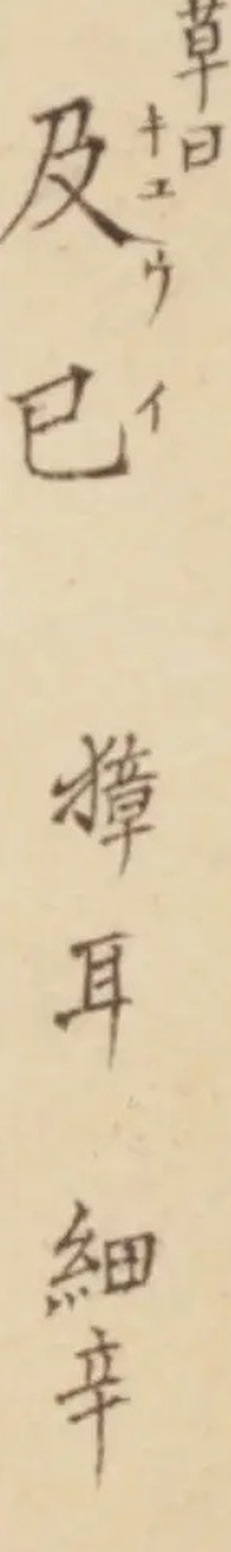及已墇耳細辛
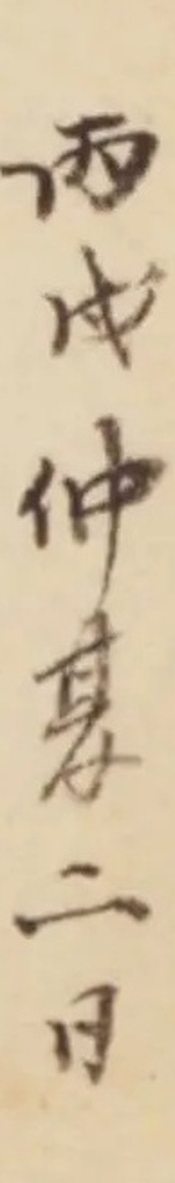丙戌仲夏二日
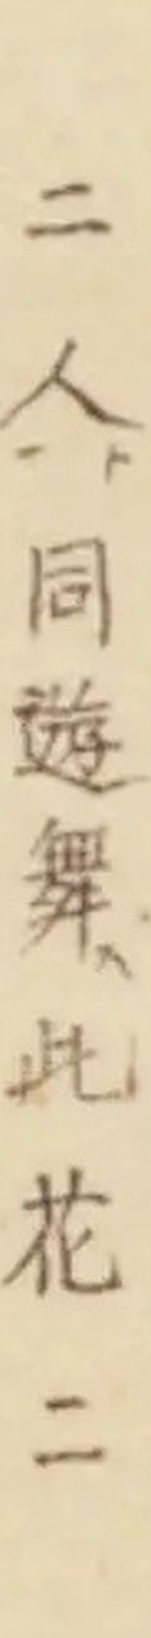二人と同遊舞へ此の花二
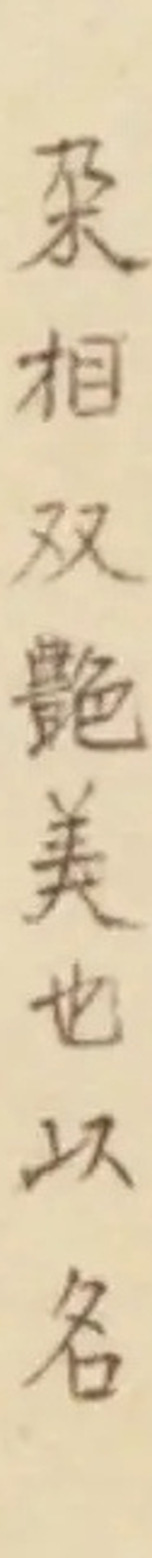朶相双艶美也以名
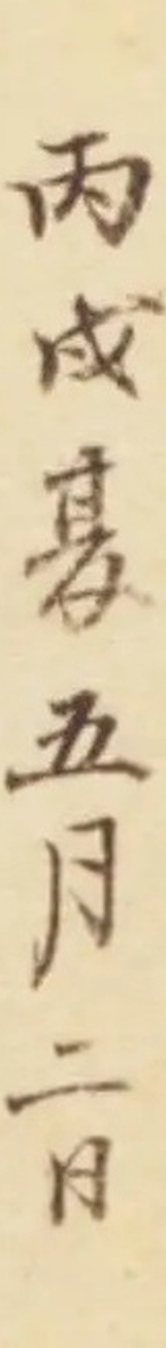丙戌夏五月二日
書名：梅園草木花譜夏之部. 3
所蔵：国立国会図書館 National Diet Library, JAPAN
